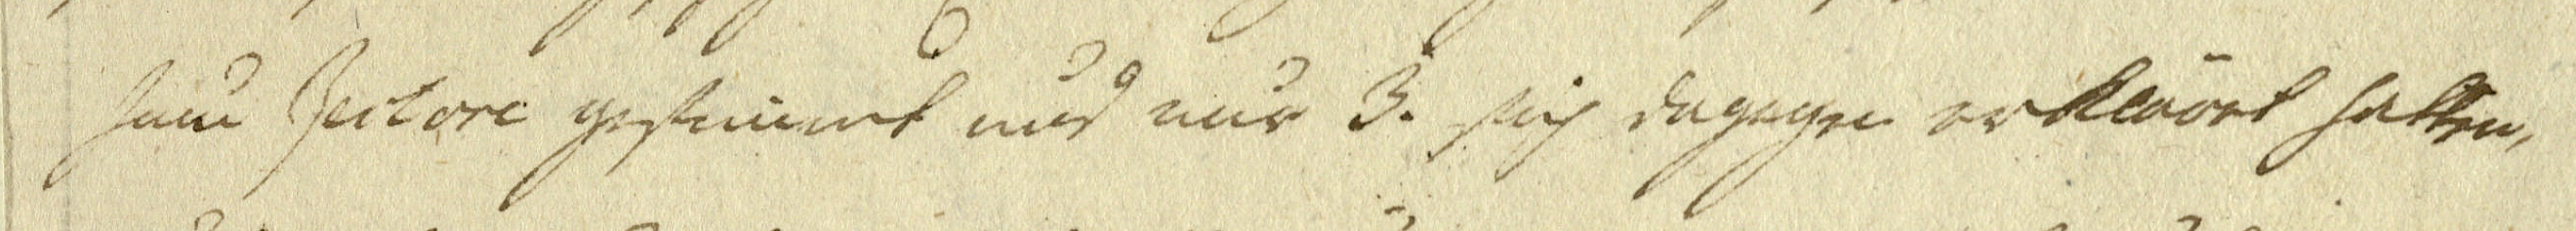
zum Rectore gestimmt und nur 3. sich dagegen erkläret hätten,
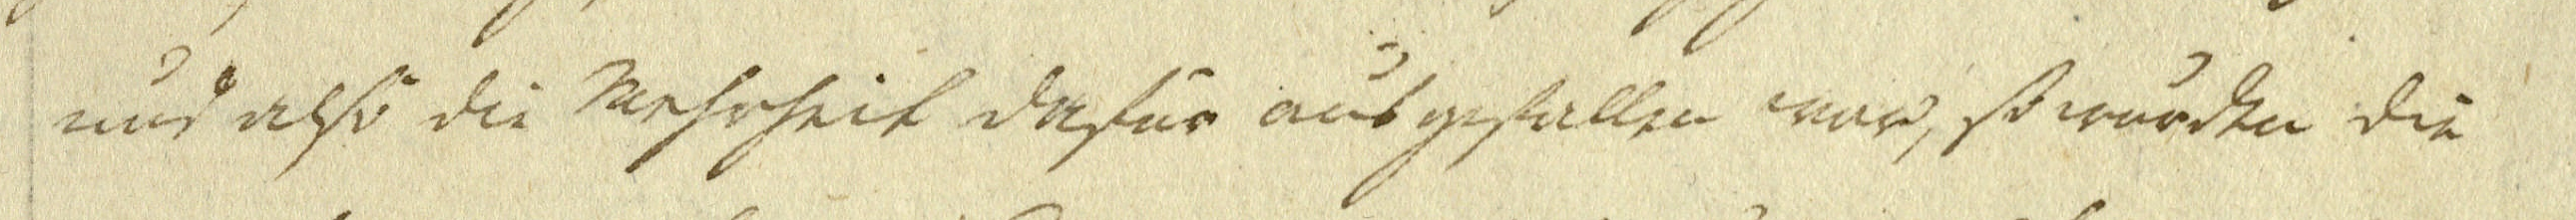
und also die Mehrheit dafür ausgefallen war, so wurden die
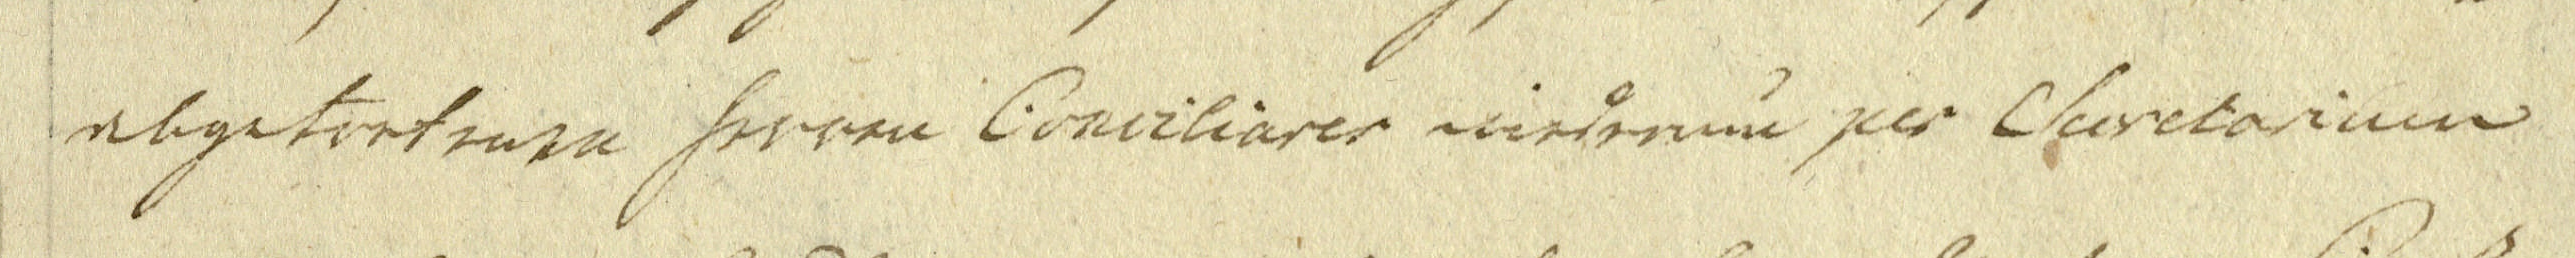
abgetretenen Herren Conciliares wiederum per Secretarium
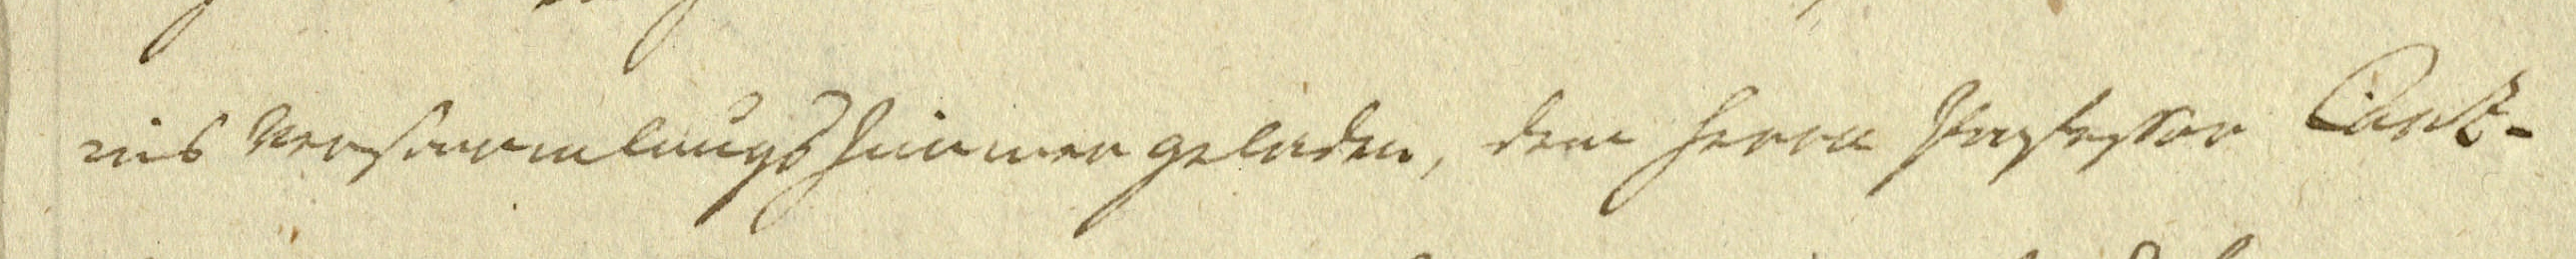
ins Versammlungs Zimmer geladen, dem Herrn Professor Canz¬
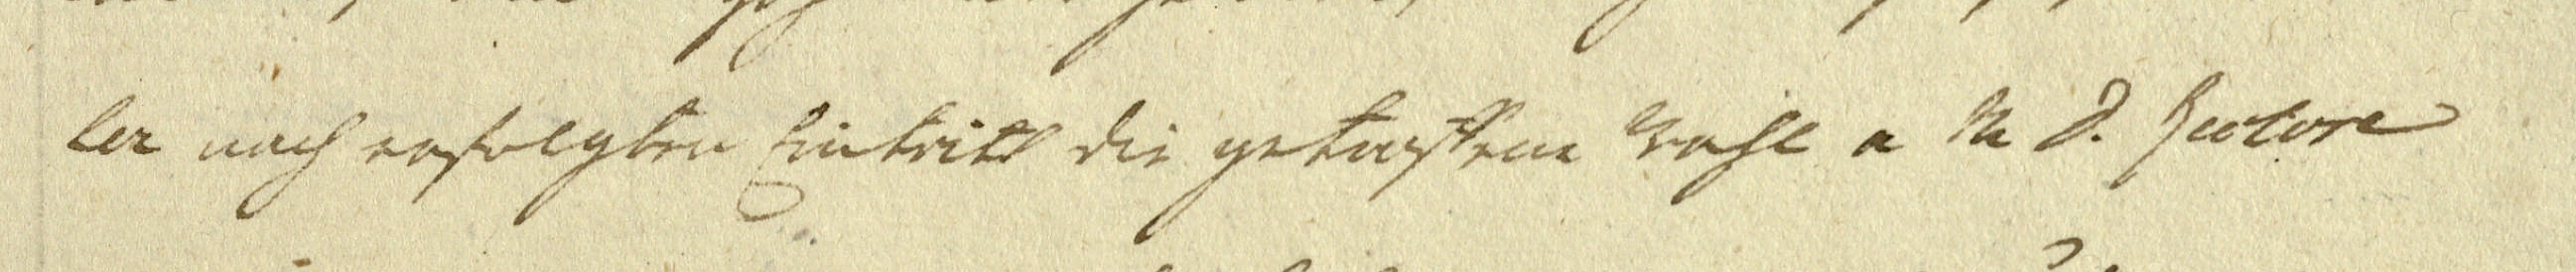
ler nach erfolgten Eintritt die getroffene Wahl a M. D. Rectore
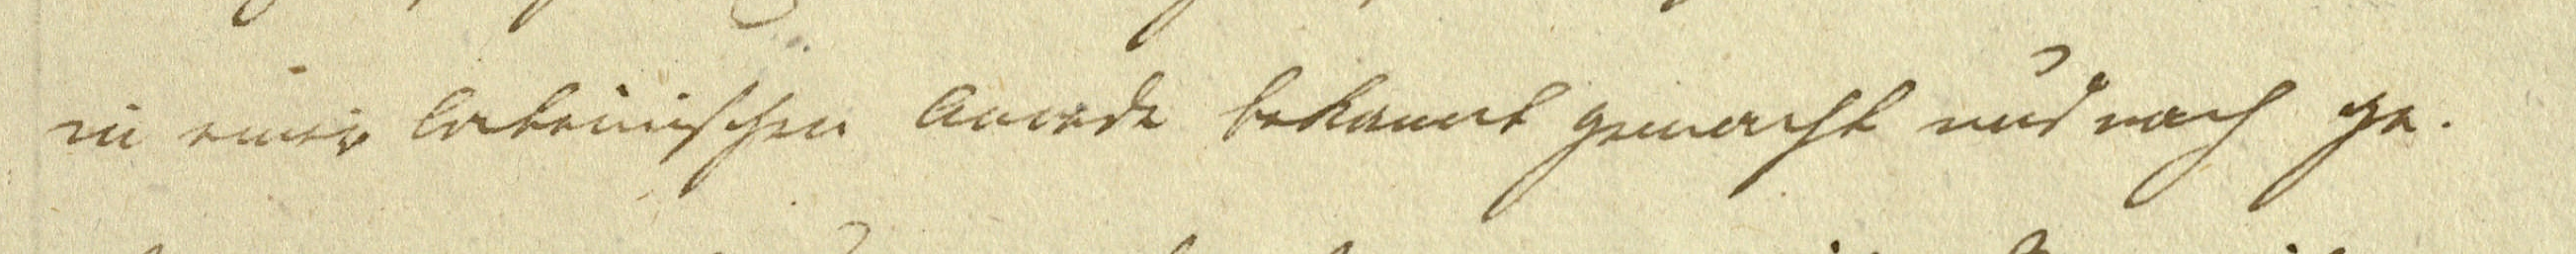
in einer lateinischen Anrede bekannt gemacht und nach ge¬
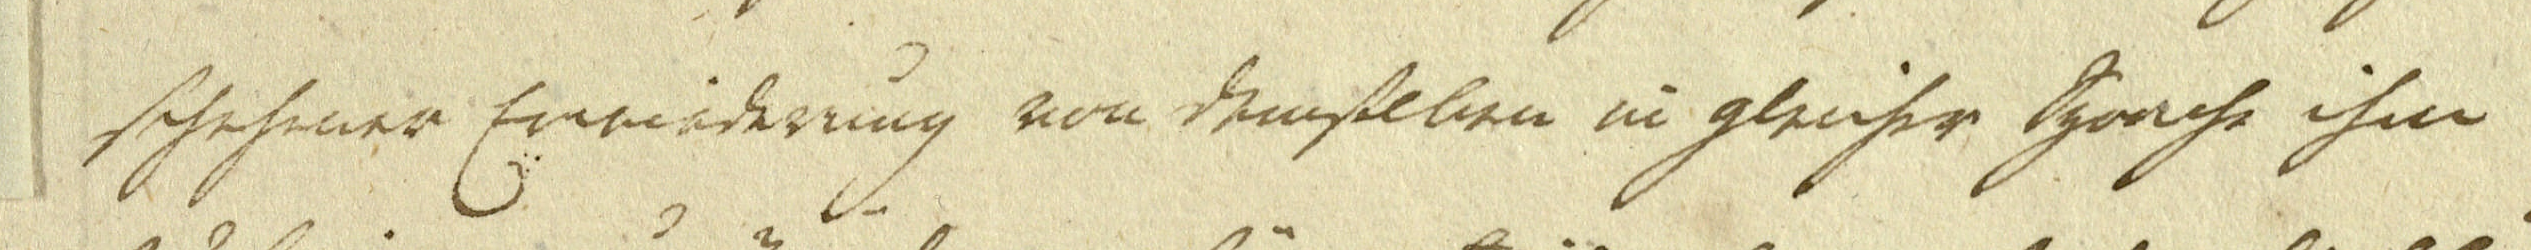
schehener Erwiederung von demselben in gleicher Sprache ihm
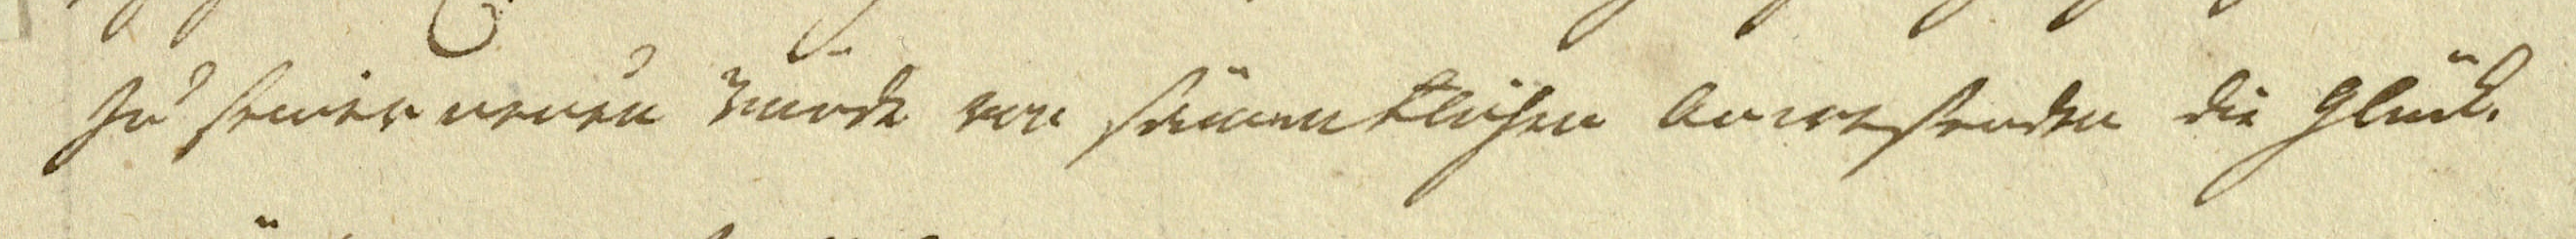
zu seiner neuen Würde von sämmtlichen Anwesenden die Glück¬
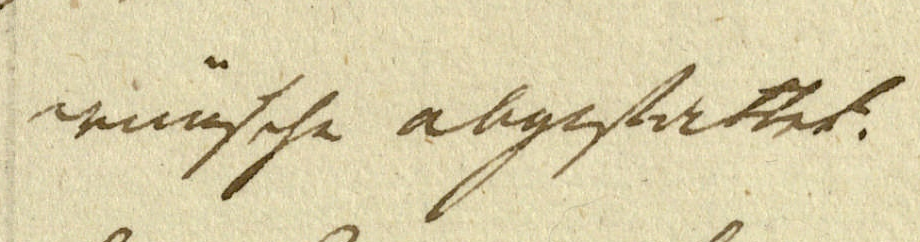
wünsche abgestattet.
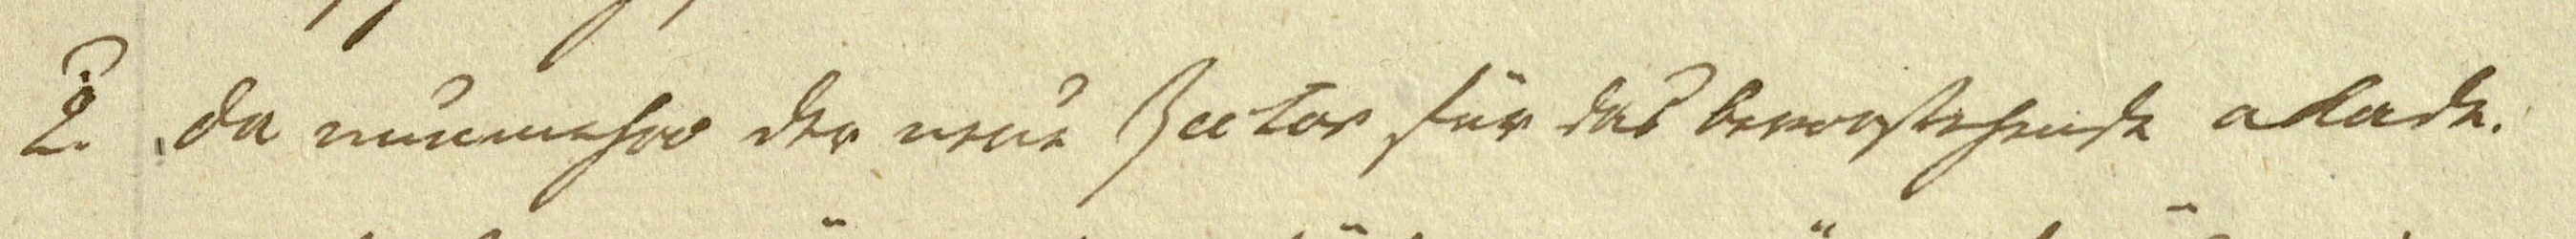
2. Da nunmehro der neue Rector für das bevorstehende akade¬
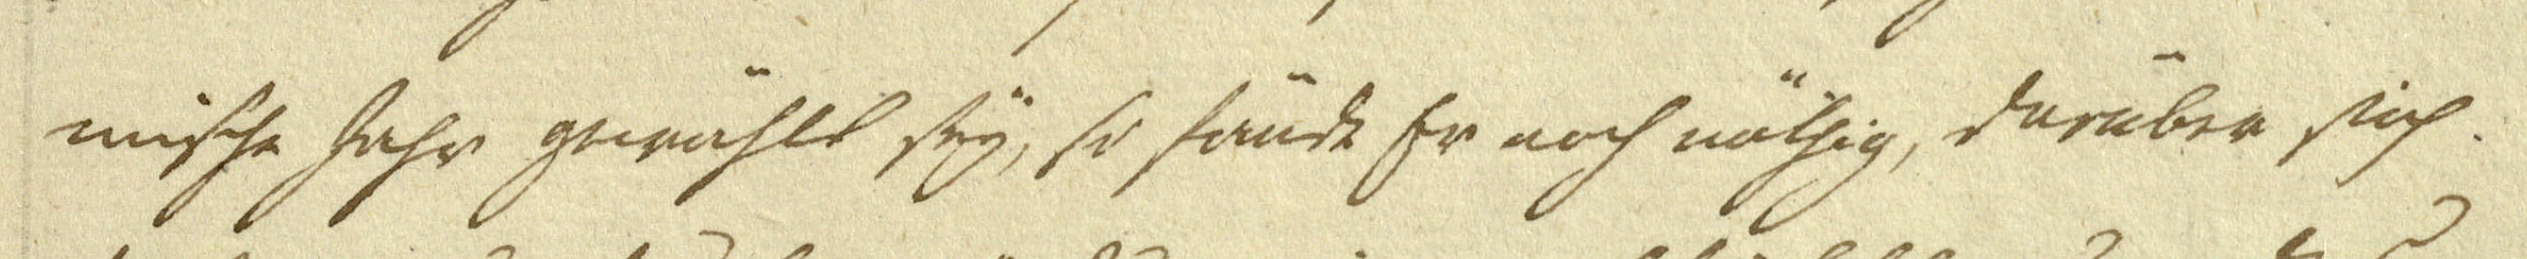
mische Jahr gewählt seÿ, so fände Er noch nöthig, darüber sich
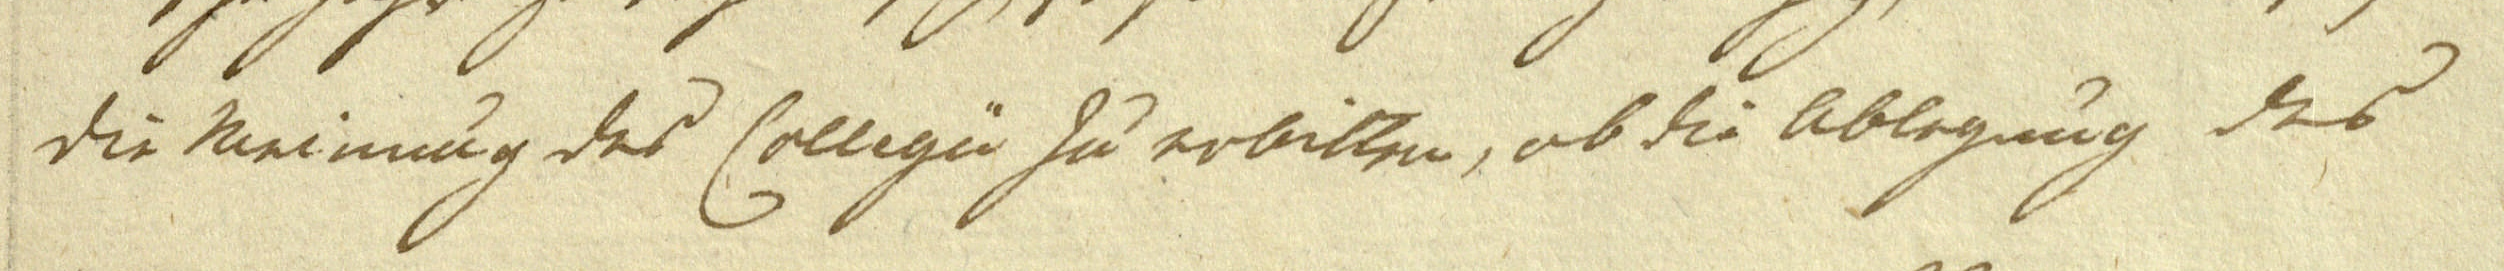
die Meinung des Collegii zu erbitten, ob die Ablegung des
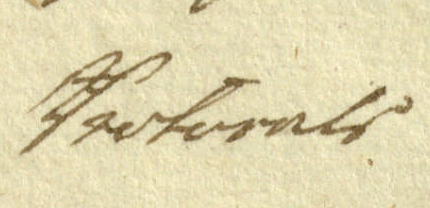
Rectorats
